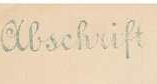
Abschrift
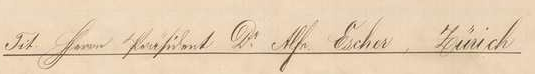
Tit. Herrn Präsident Dr Alfr. Escher, Zürich
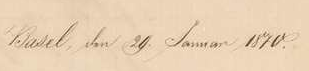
Basel, den 29. Januar 1870.
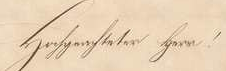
Hochgeachteter Herr!
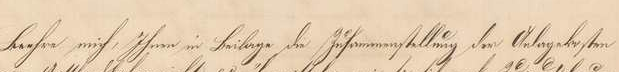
Beehre mich, Ihnen in Beilage die Zusammenstellung der Anlagagekosten
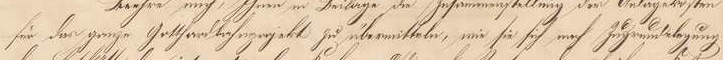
für das ganze Gotthardbahnprojekt zu übermitteln, wie sie sich nach Zugrundelegung
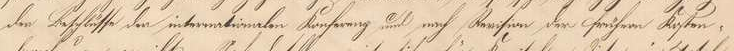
der Beschlüsse der internationalen Konferenz und nach Revision der frühern Kosten-
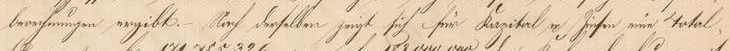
berechnungen ergibt. – Nach derselben zeigt sich für Kapital & Zinsen eine Total-
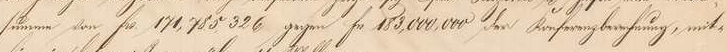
summe von frs. 171,785,326 gegen frs 183,000,000 der Konferenzberechnung, mit-
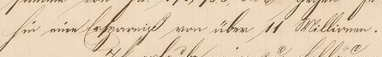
hin eine Ersparniß von über 11 Millionen.
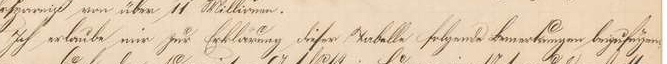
Ich erlaube mir zur Erklärung dieser Tabelle folgende Bemerkungen beizufügen:
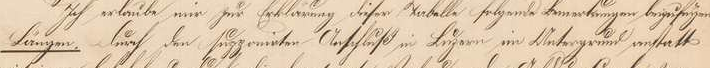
Längen. Durch den supponirten Anschluß in Luzern im Untergrund anstatt
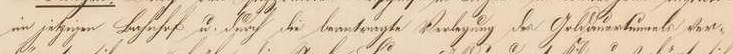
im jetzigen Bahnhof u. durch die beantragte Verlegung des Goldauertunnels ver-
